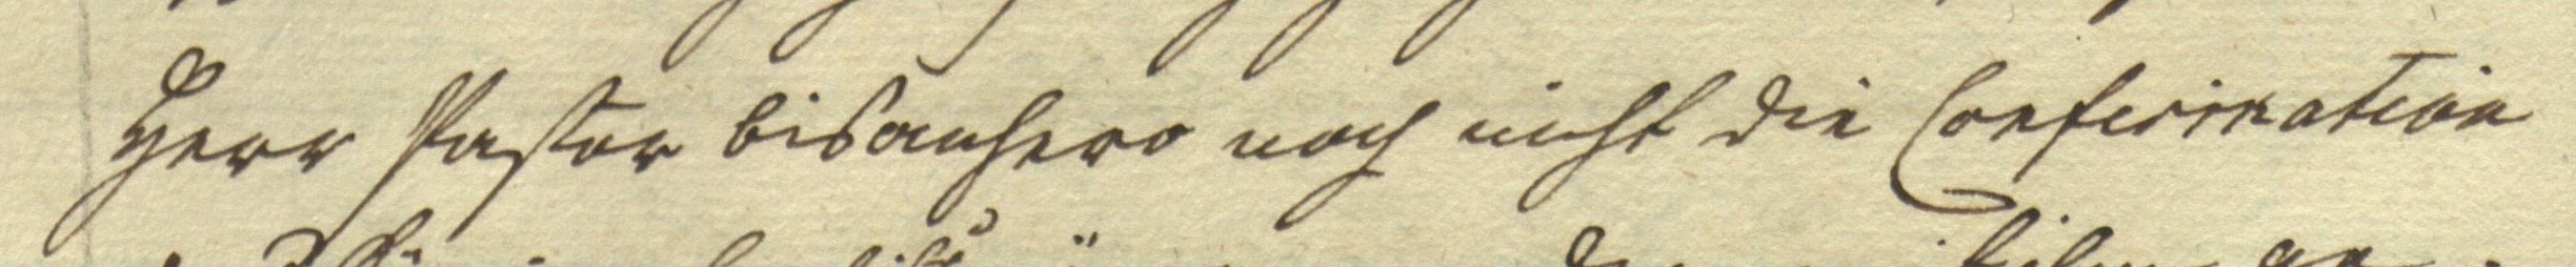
Herr Pastor bisanhero noch nicht die Confirmation
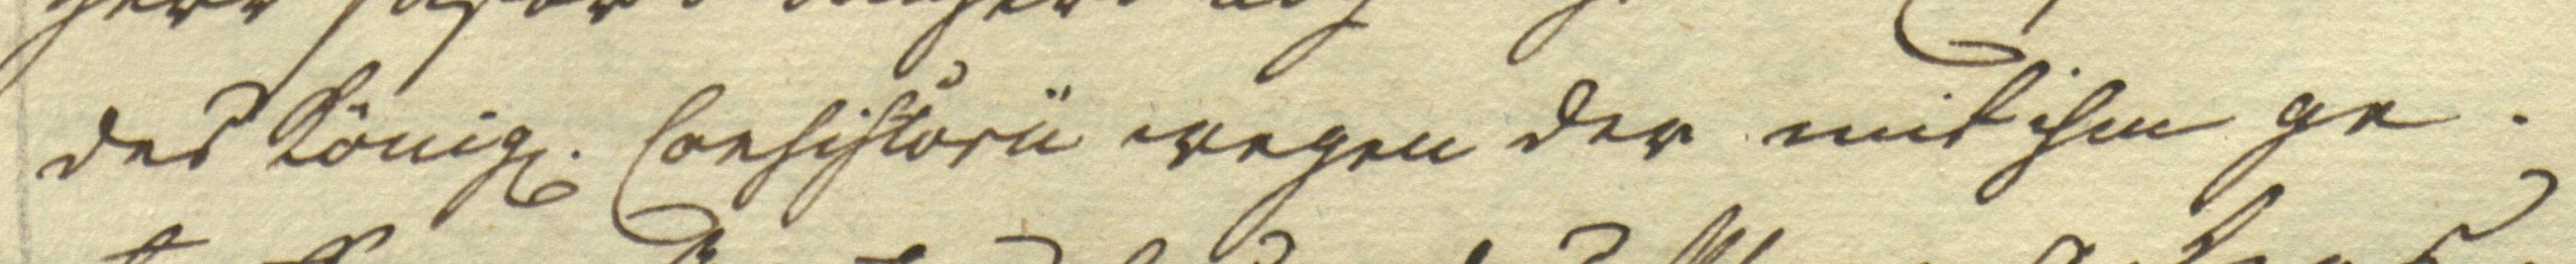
des Königl. Consistorii wegen der mit ihm ge¬
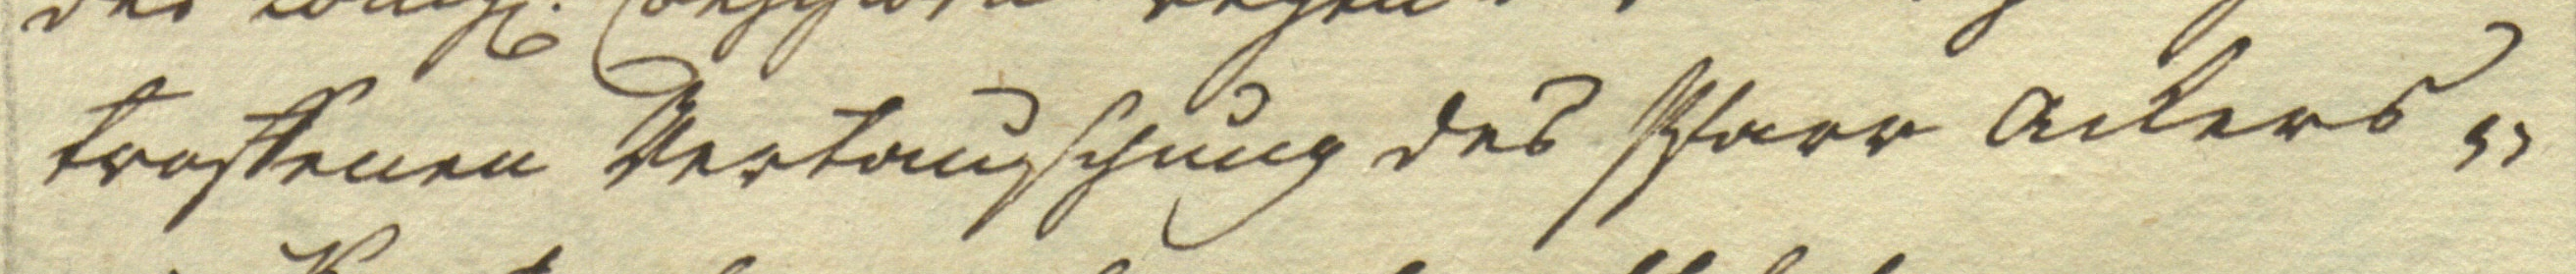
troffenen Vertauschung des Pfarr Ackers
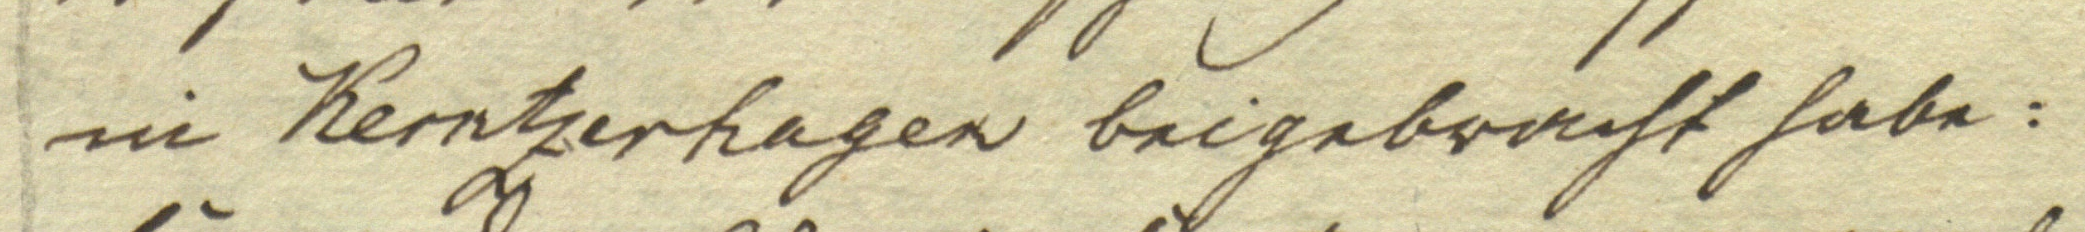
in Kemtzerhagen beigebracht habe:
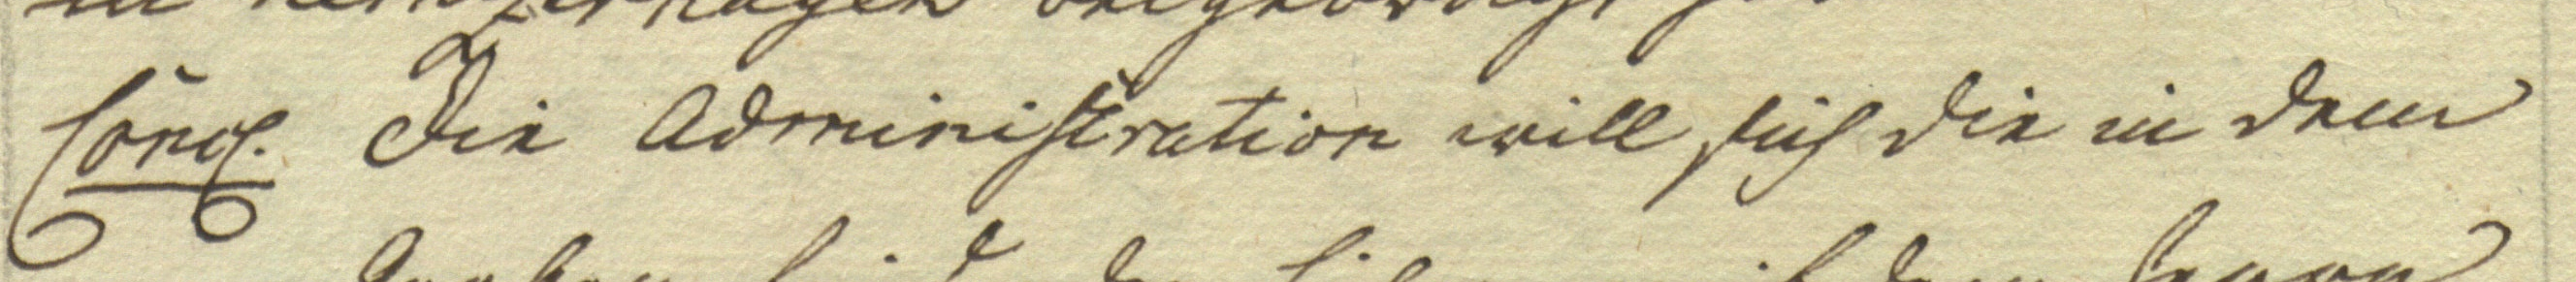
Concl. Die Administration will sich die in dem
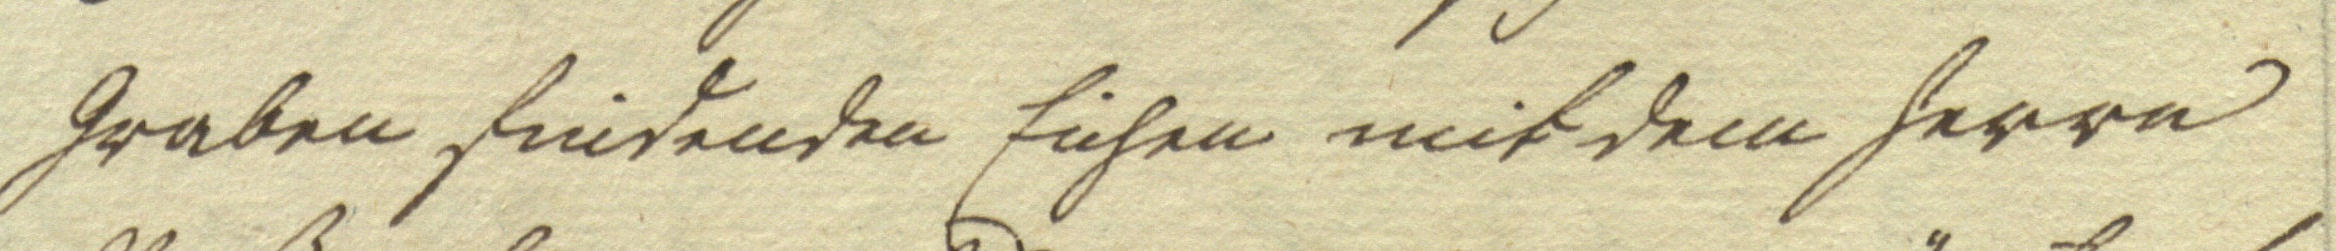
Graben findenden Eichen mit dem Herrn
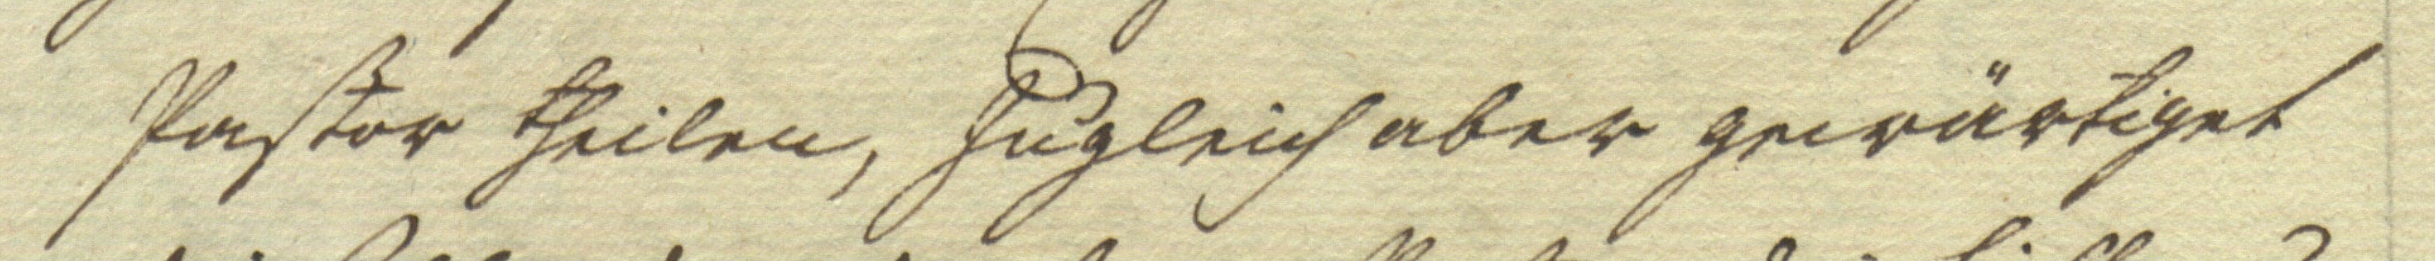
Pastor theilen, zugleich aber gewärtiget
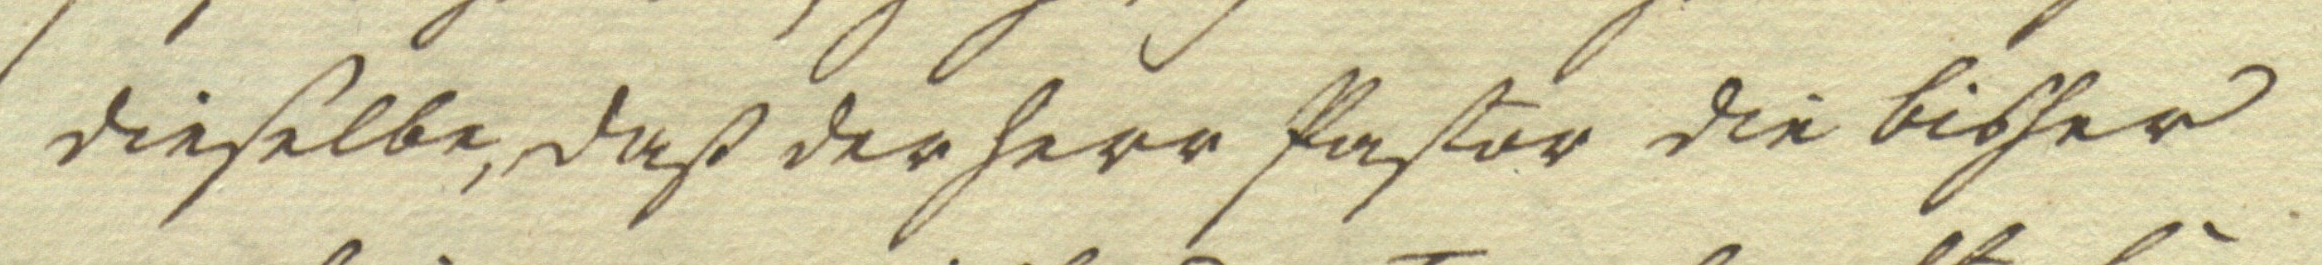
dieselbe, daß der Herr Pastor die bisher
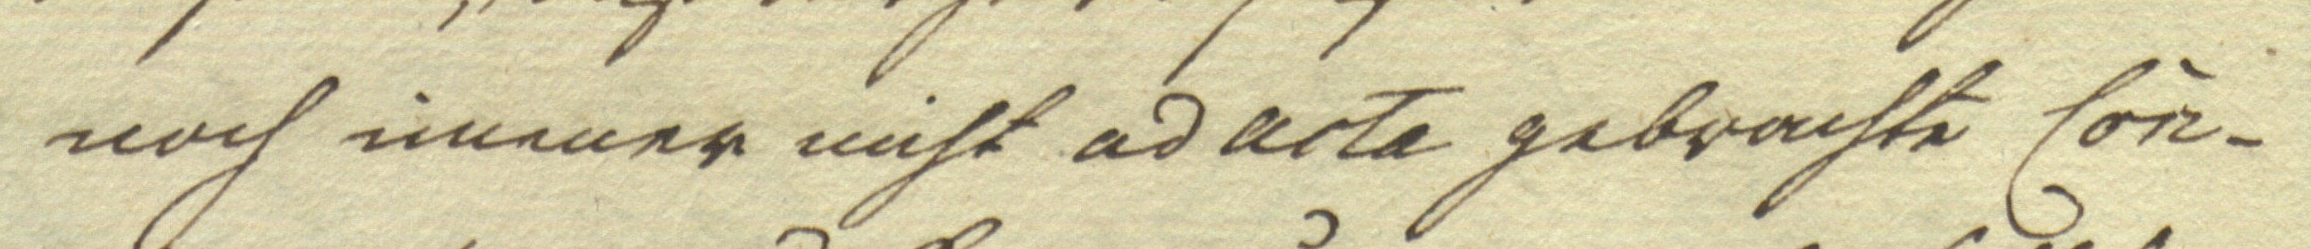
noch immer nicht ad acta gebrachte Con¬
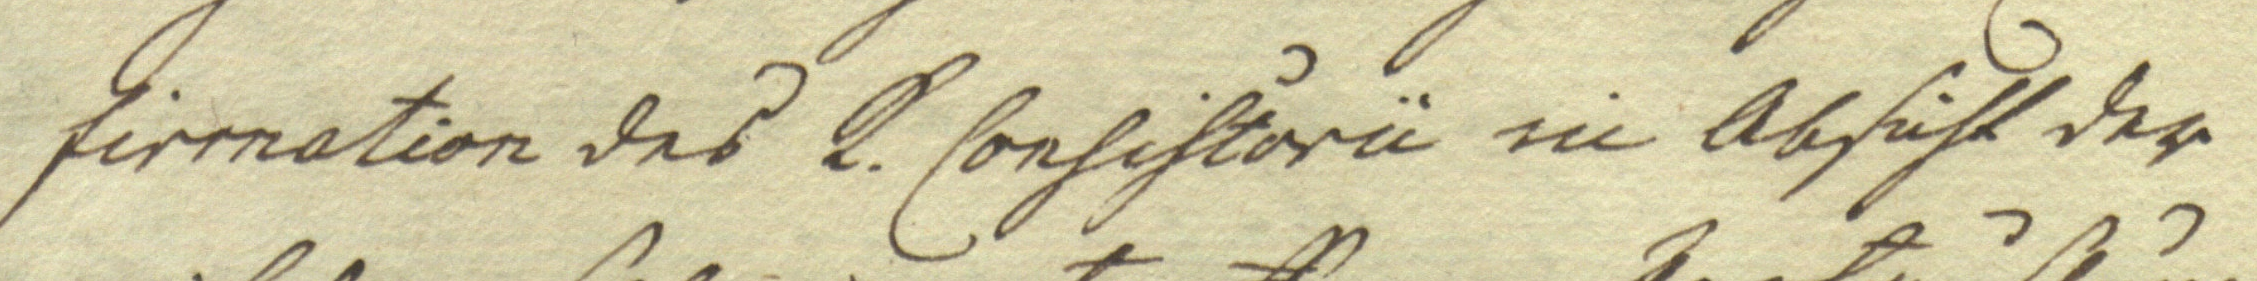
firmation des K. Consistorii in Absicht der
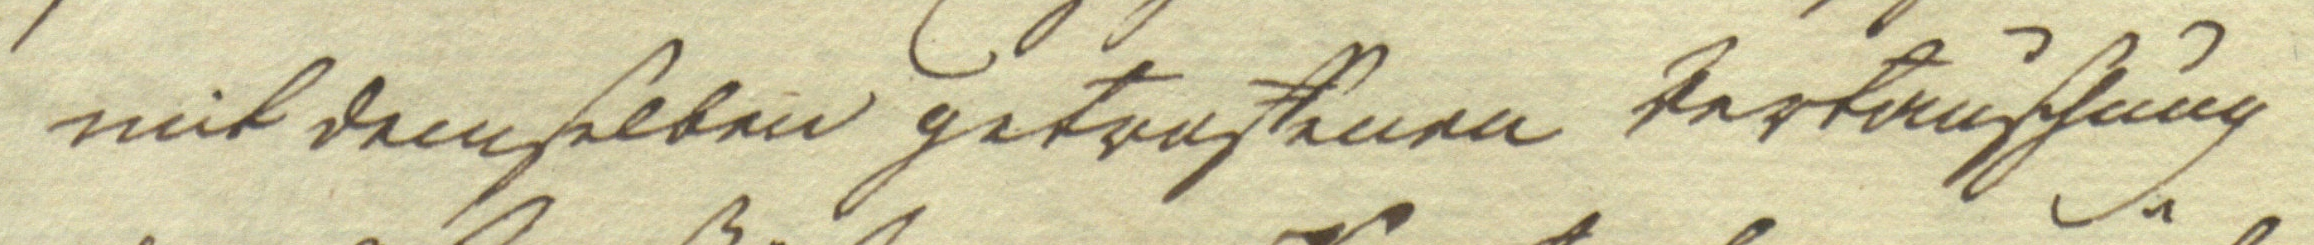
mit demselben getroffenen Vertauschung
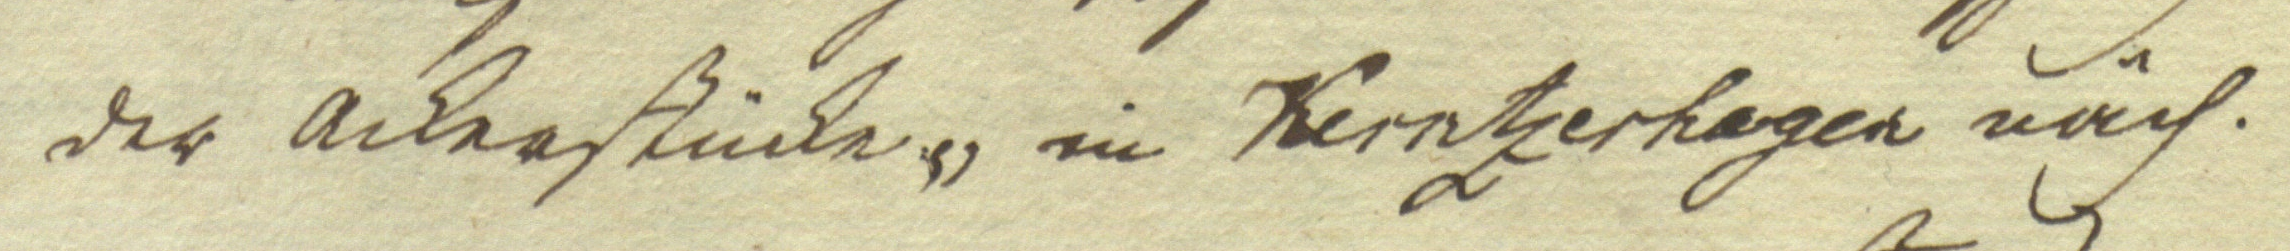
der Ackerstücke in Kemtzerhagen näch¬
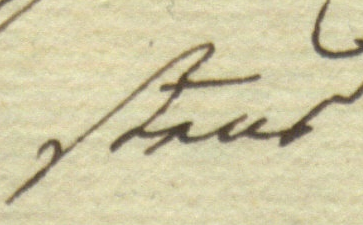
stens
